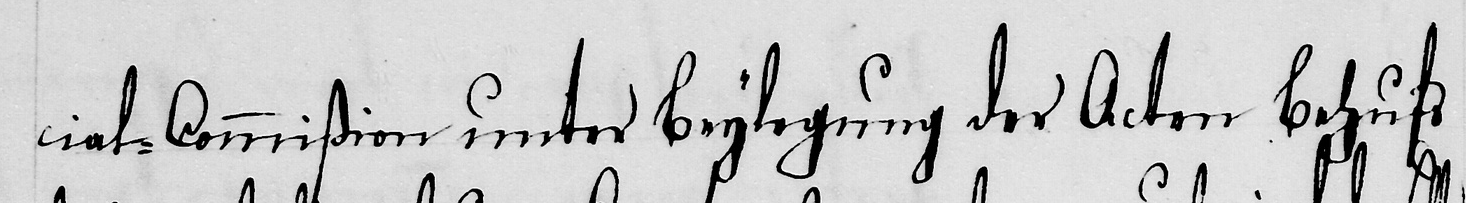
cial-Commißion unter Beylegung der Acten Behufs
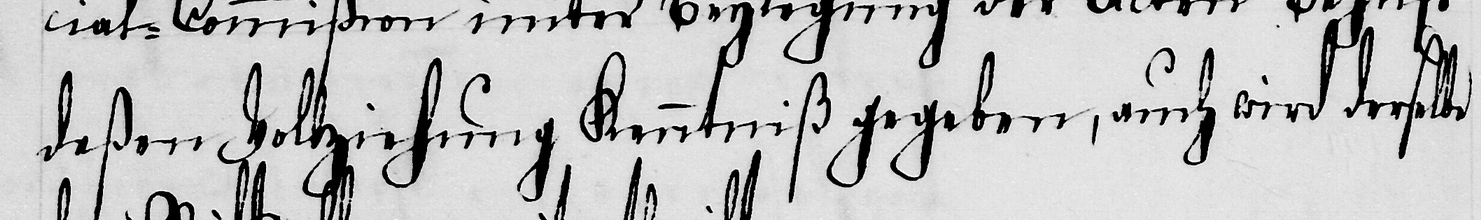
deßen Vollziehung Kenntniß gegeben, auch wird derse¬
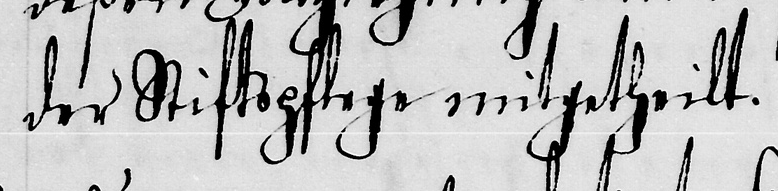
der Stiftspflege mitgetheilt.
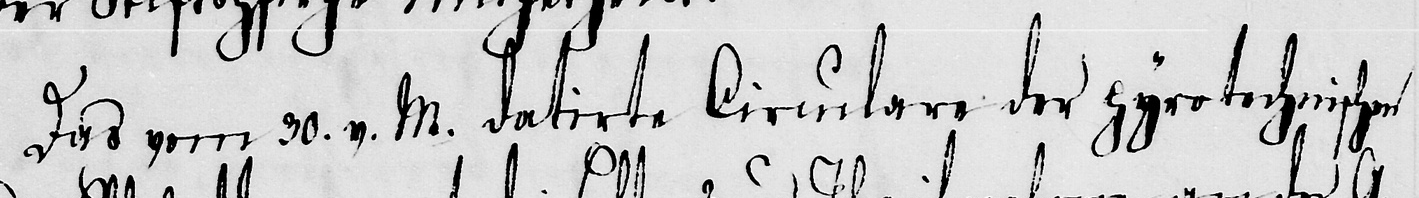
Das vom 30. v. M. datirte Circulare der pyrotechischen
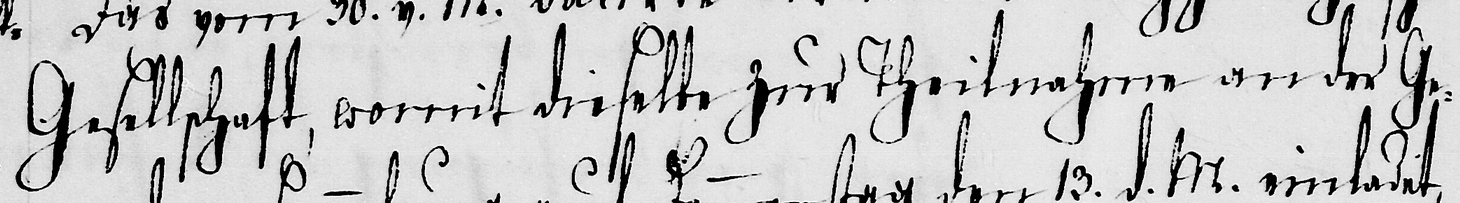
Gesellschaft, womit dieselbe zur Theilnahme an der G¬
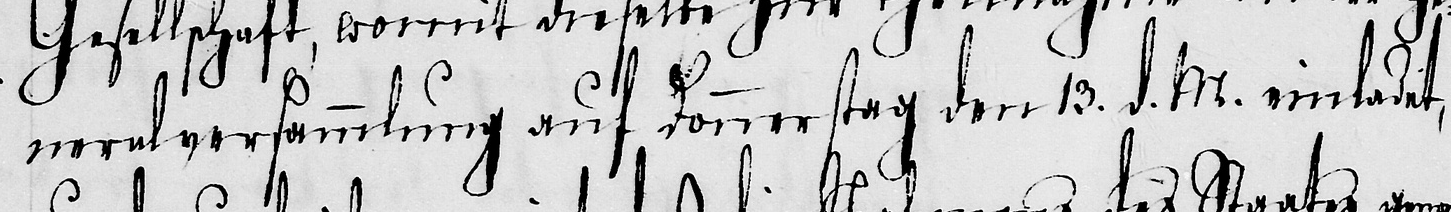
eneralversammlung auf Donnerstag den 13. d. M. einlade¬
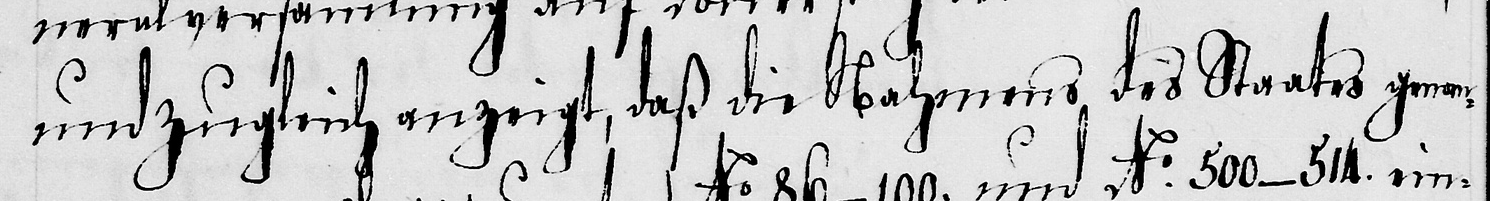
und zugleich anzeigt, daß die Nahmens des Staates geno¬
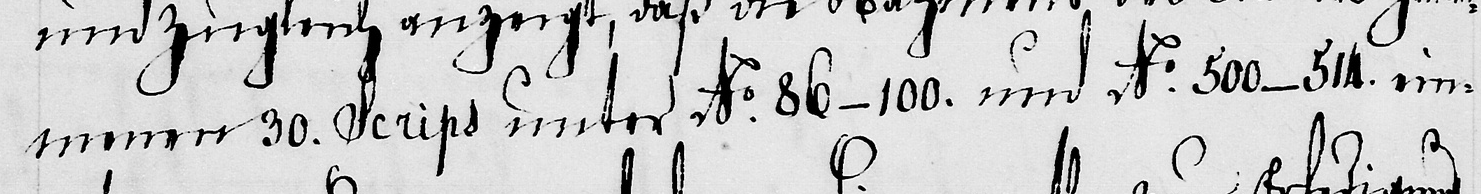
mmenen 30. Scrips unter N°. 86–100. und N°. 500–514. ein¬
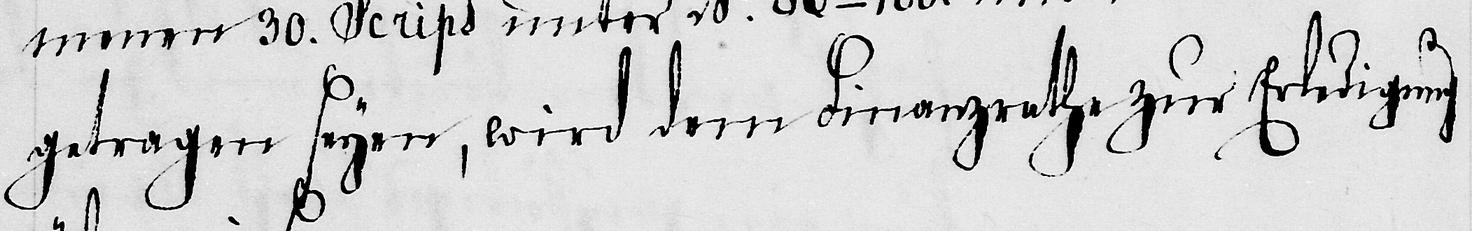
getragen seyen, wird dem Finanzrathe zur Erledigung
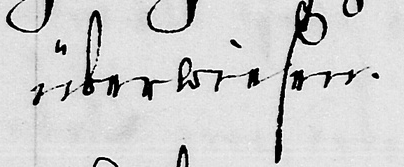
überwiesen.
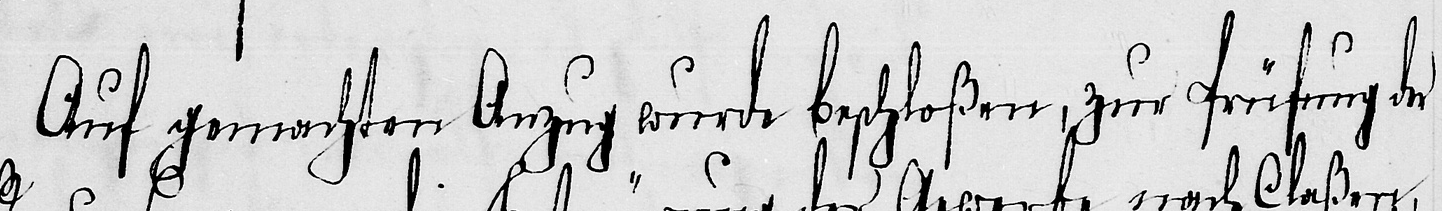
Auf gemachten Anzug wurde beschloßen, zur Prüfung d¬
